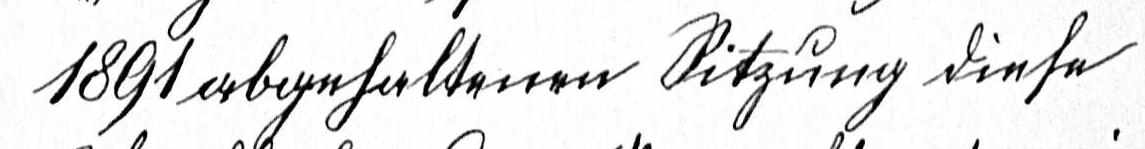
1891 abgehaltenen Sitzung diese
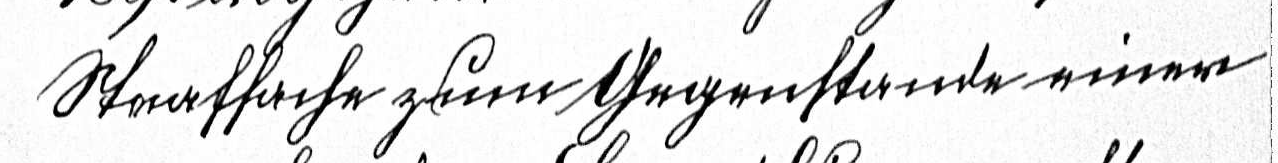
Strafsache zum Gegenstande einer
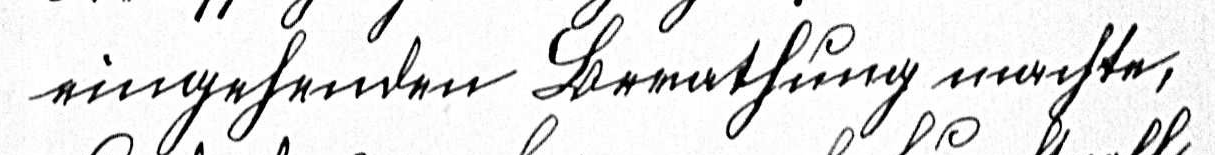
eingehenden Berathung machte,
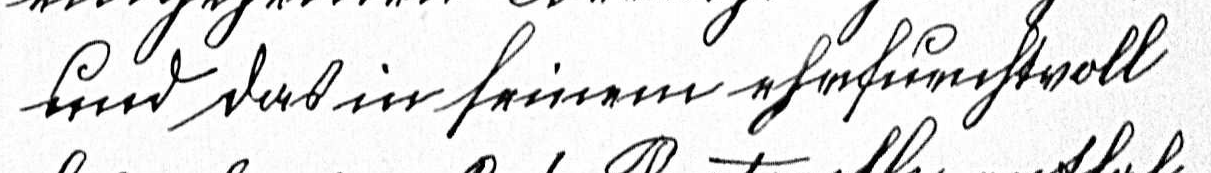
und das in seinem ehrfurchtvoll
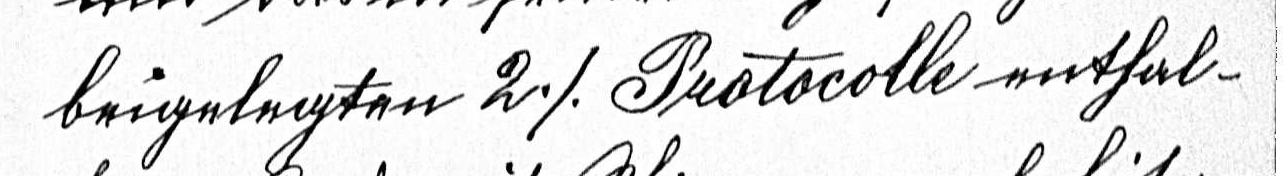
beigelegten 2) Protocolle enthal¬
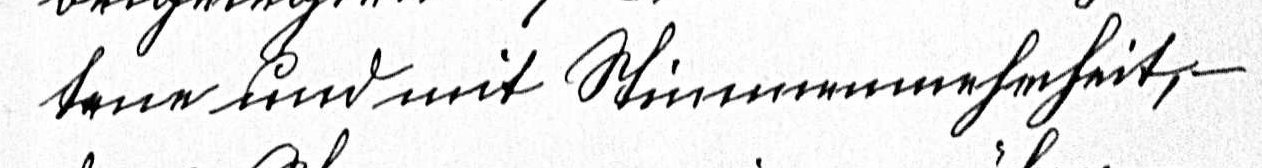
tene und mit Stimmenmehrheit,
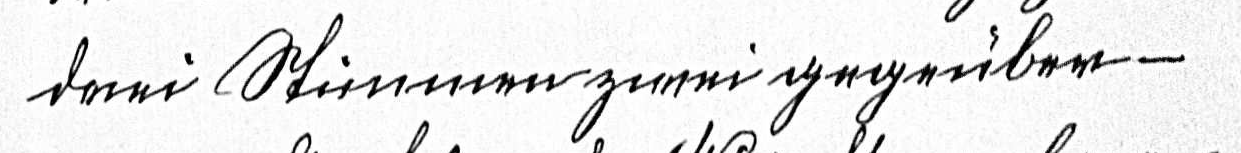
drei Stimmen zwei gegeüber –
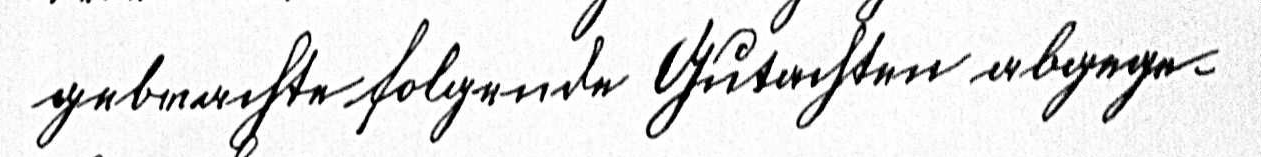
gebrachte folgende Gutachten abgege¬
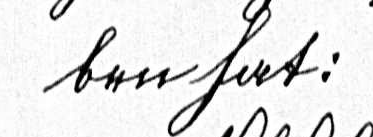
ben hat:
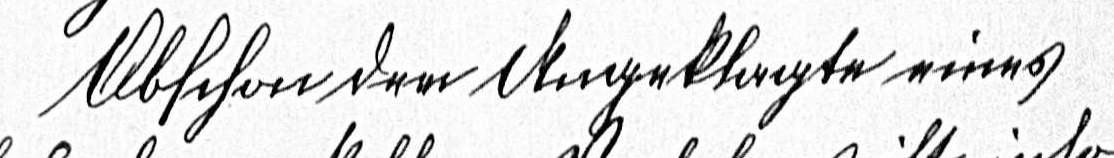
Obschon der Angeklagte eines
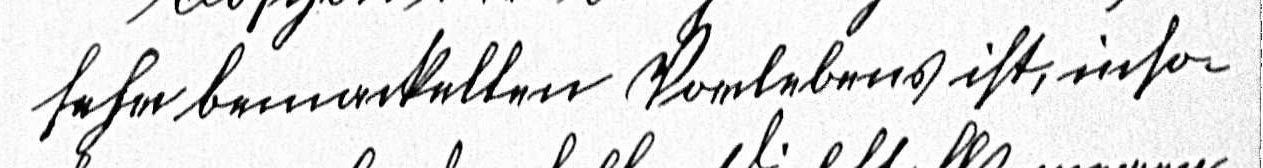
sehr bemackelten Vorlebens ist, inso¬
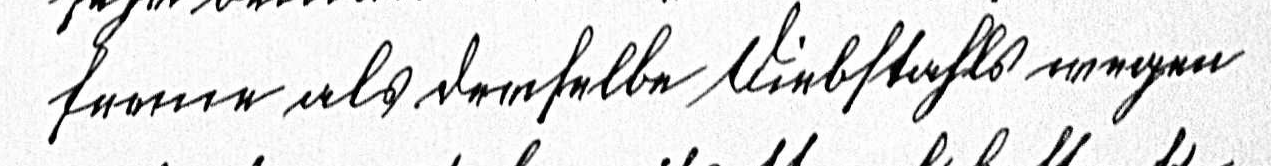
ferne als derselbe Diebstahls wegen
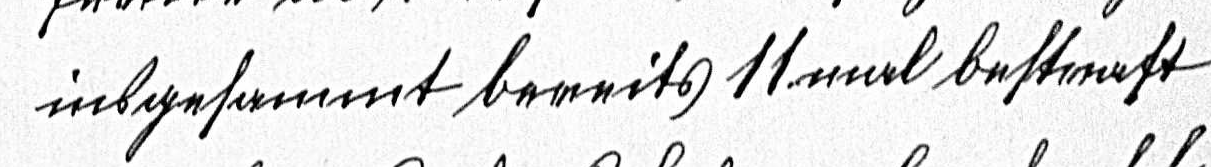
insgesammt bereits 11mal bestraft
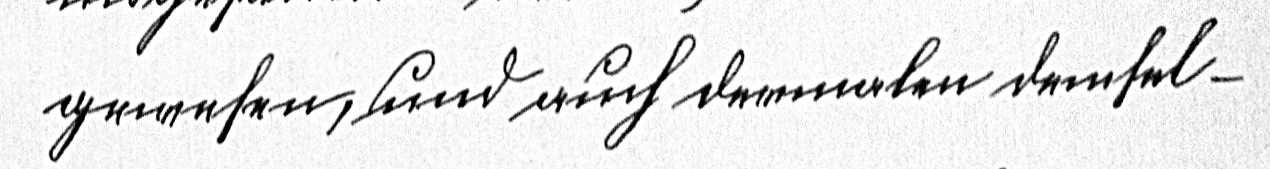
gewesen, und auch dermalen damsel¬
